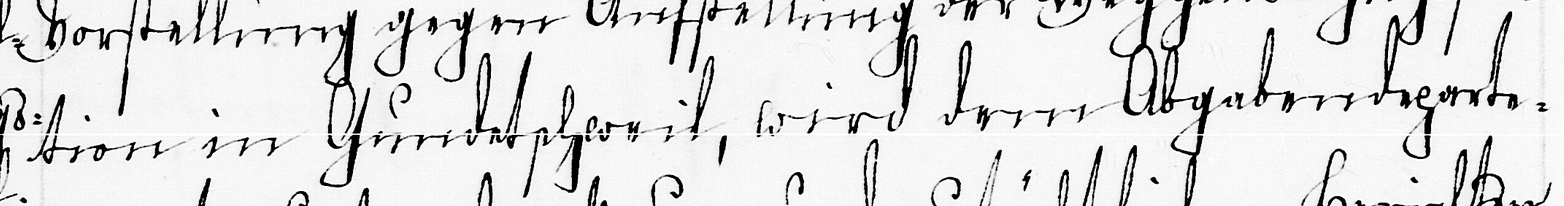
tion in Gundetschweil, wird dem Abgabendeparte¬
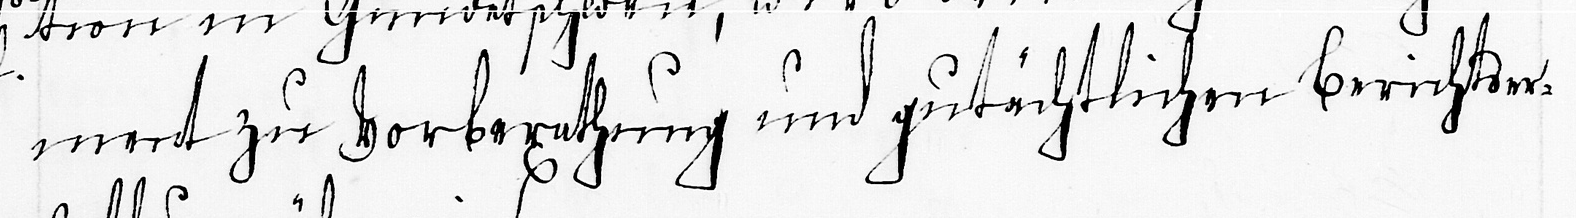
ment zu Vorberathung und gutächtlichen Berichter¬
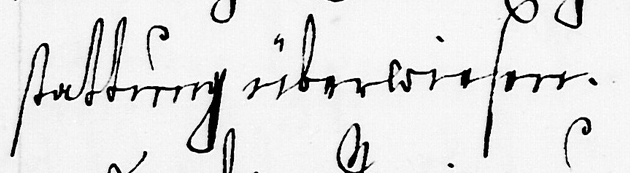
stattung überwiesen.
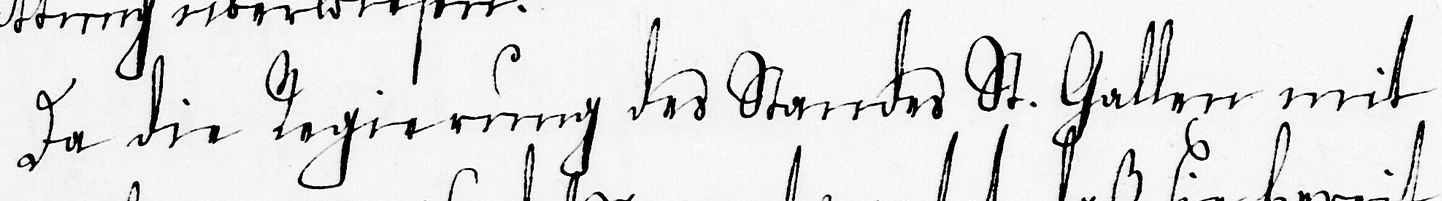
Da die Regierung des Standes St. Gallen mit
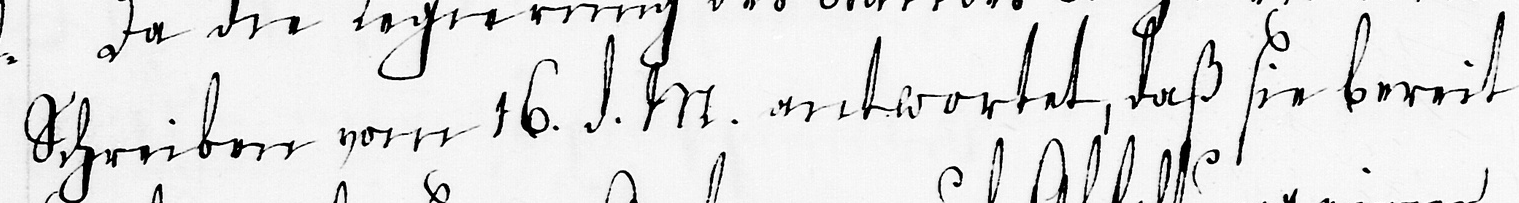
Schreiben vom 16. d. M. antwortet, daß sie bereit
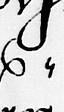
s¬
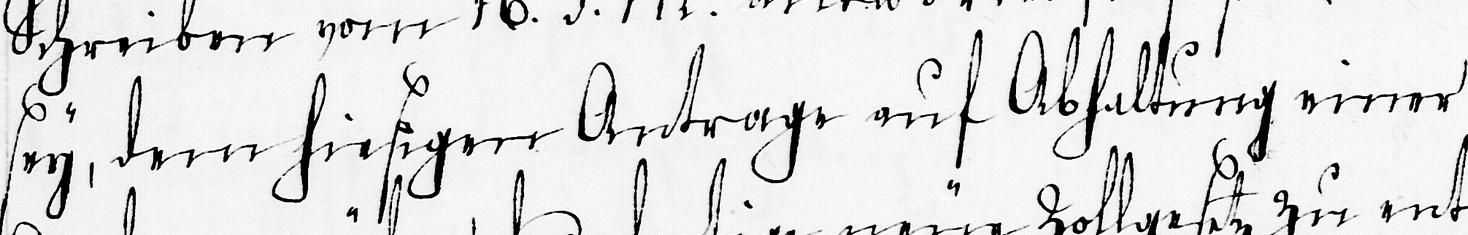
ey, dem hiesigen Antrage auf Abhaltung einer
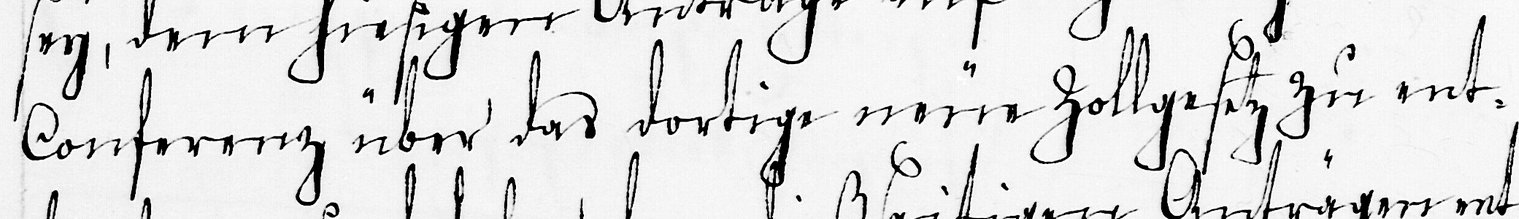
Conferenz über das dortige neue Zollgesetz zu ent¬
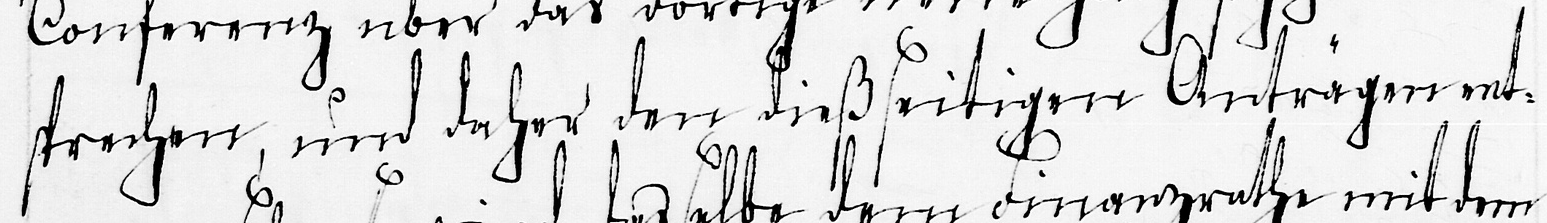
sprechen, und daher den dießseitigen Anträgen ent¬
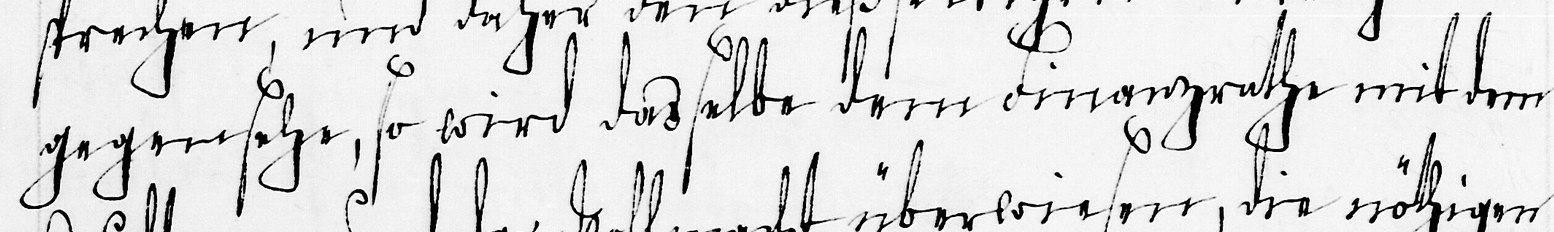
gegensehe, so wird dasselbe dem Finanzrathe mit dem
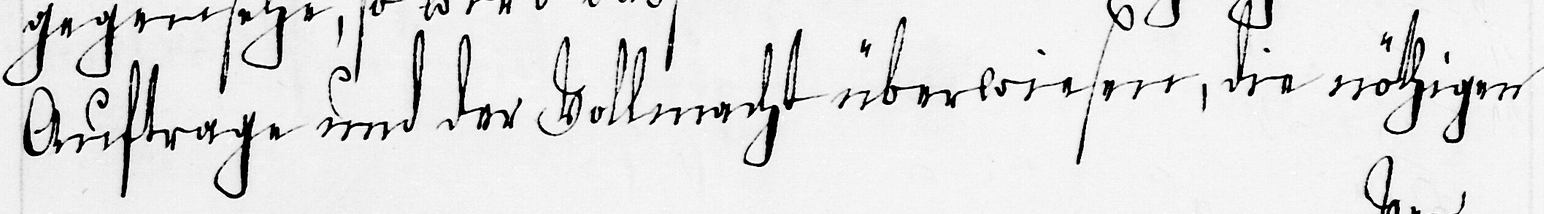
Auftrage und der Vollmacht überwiesen, die nöthigen
